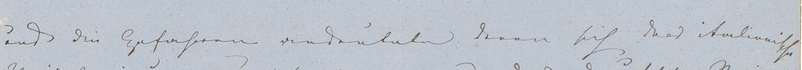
und die Gefahren andeutete denen sich das italienische
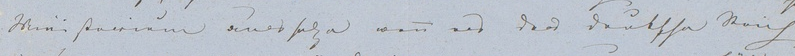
Ministerium aussetze wenn es das deutsche Reich
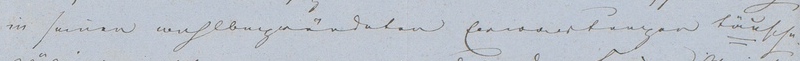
in seinen wohlbegründeten Erwartungen täusche.
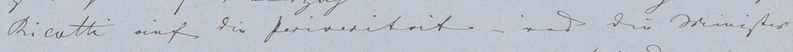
Ricotti auf die Priorität – und die Minister
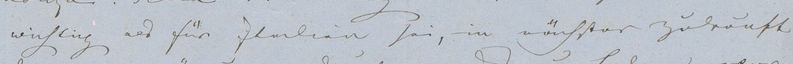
wichtig es für Italien sei, in nächster Zukunft
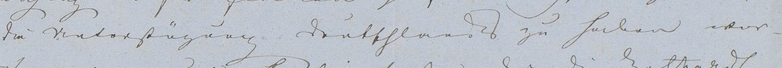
die Unterstüzung Deutschlands zu haben ver-
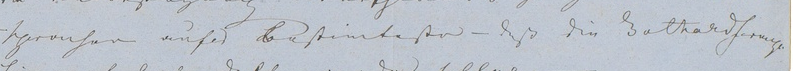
sprachen aufs Bestimteste – daß die Gothard Frage
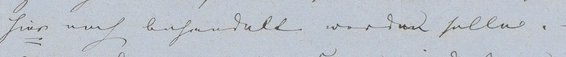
hier noch behandelt werden solle. –
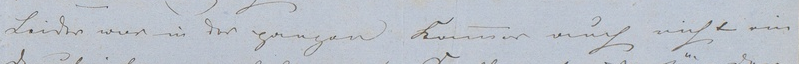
Leider war in der ganzen Kammer auch nicht ein
